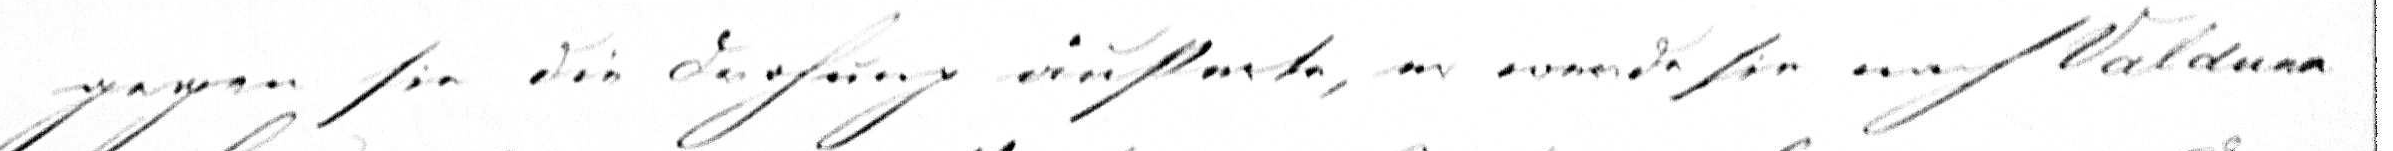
gegen sie die Drohung äußerte, er werde sie nach Valduna
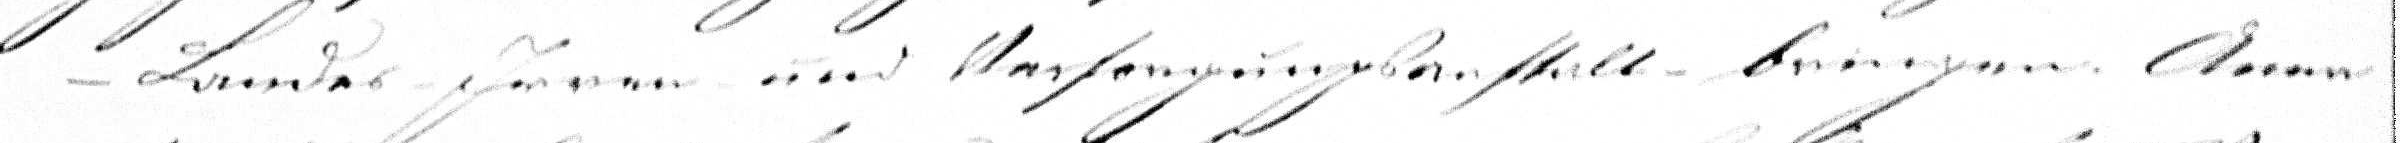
-Landes-Irren und Versorgungsanstalt - bringen. Anna
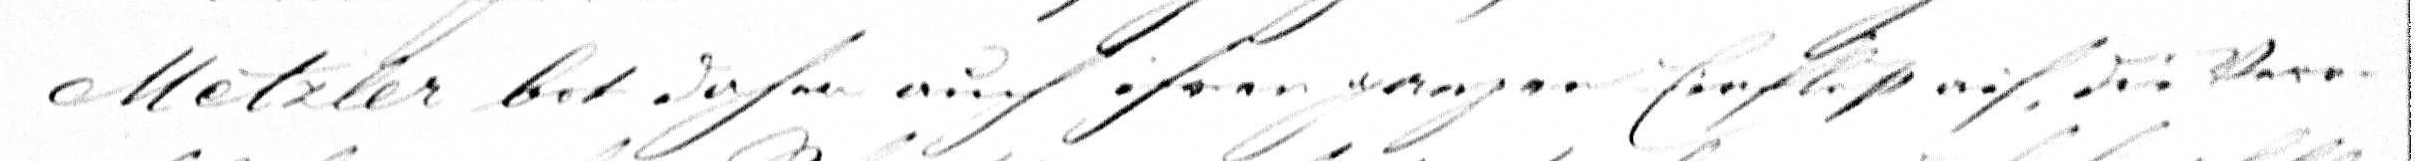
Metzler bot daher auch ihren ganzen Einfluß auf, die Vere¬
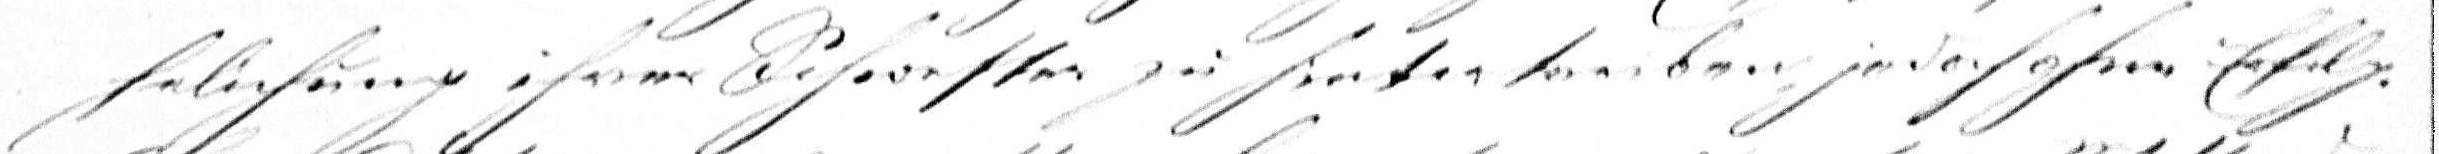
helichung ihrer Schwester zu hintertreiben, jedoch ohne Erfolg.
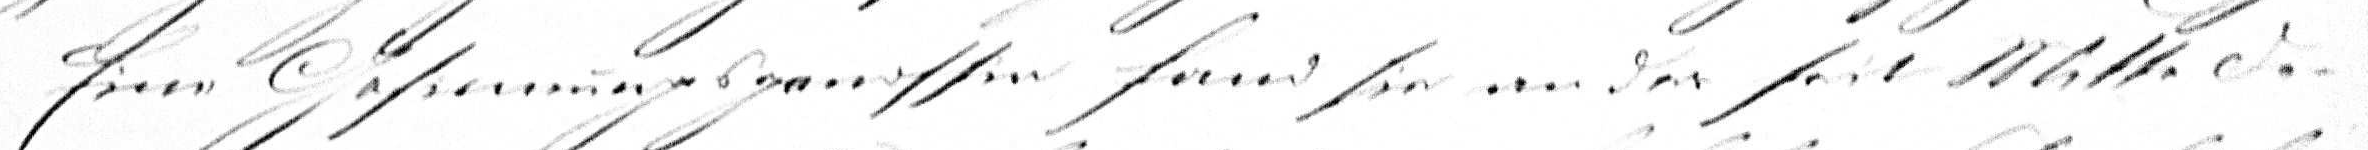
Eine Gesinnungsgenossen fand sie an der seit Mitte De¬
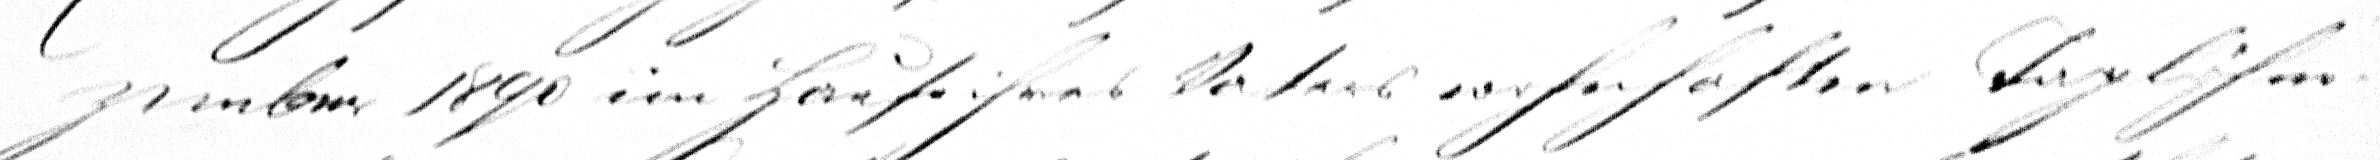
zember 1890 im Hause ihres Vaters wohnhaften Taglöhne¬
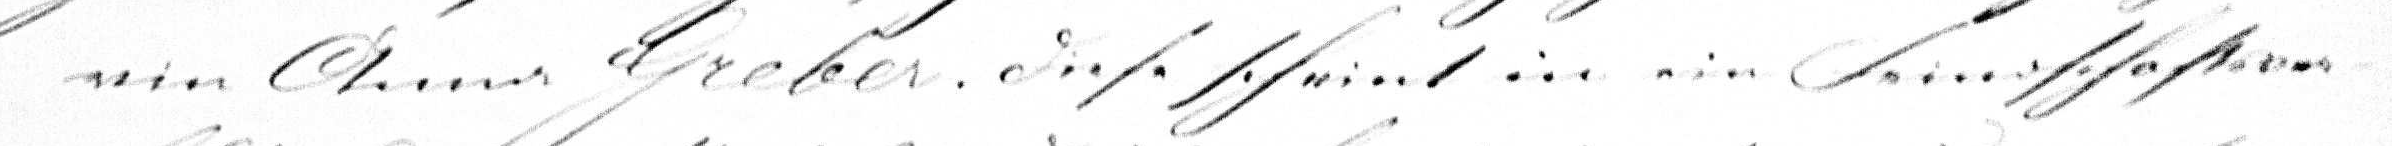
rin Anna Greber. Diese scheint in ein Feindschaftsver¬
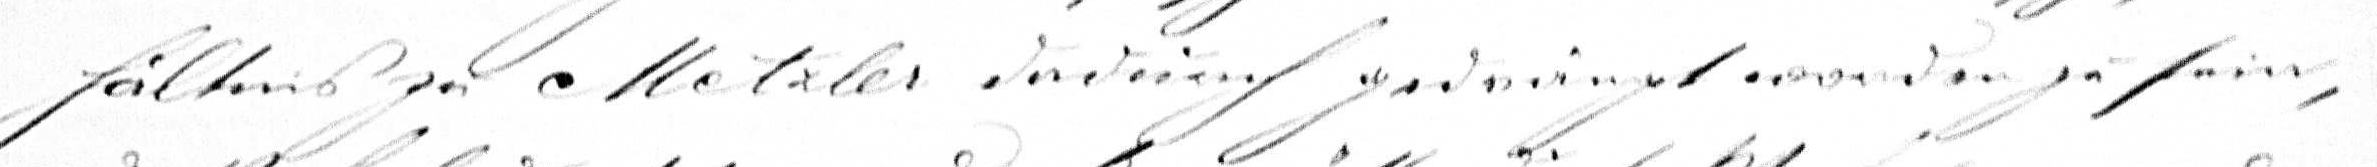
hältnis zu Metzler dadurch gedrängt worden zu sein,
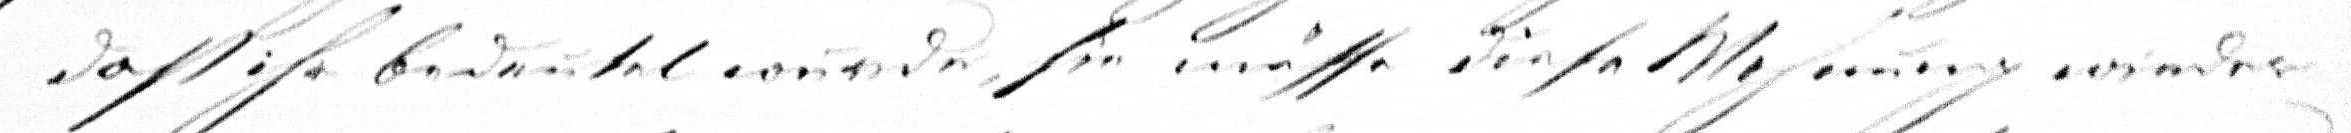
daß ihr bedeutet wurde, sie müsse diese Wohnung wieder
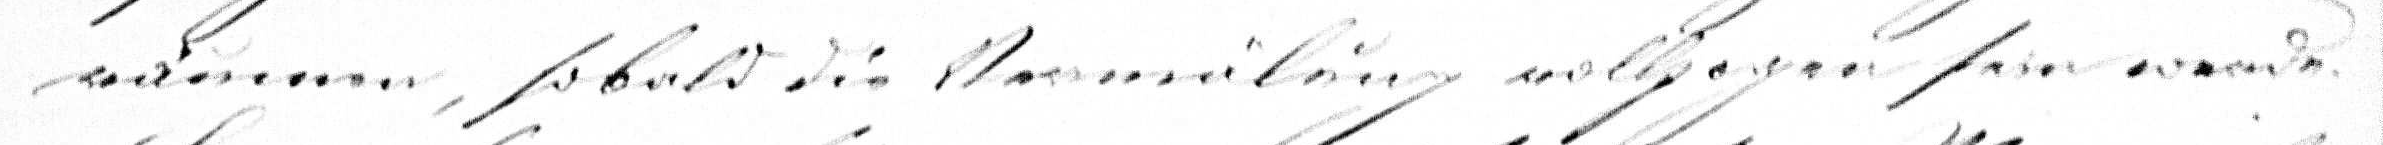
räumen, so bald die Vermälung vollzogen sein werde.
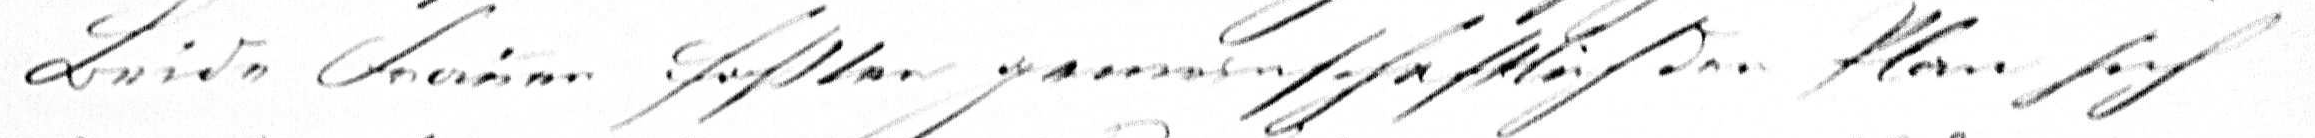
Beide Frauen faßten gemeinschaftlich den Plan sich
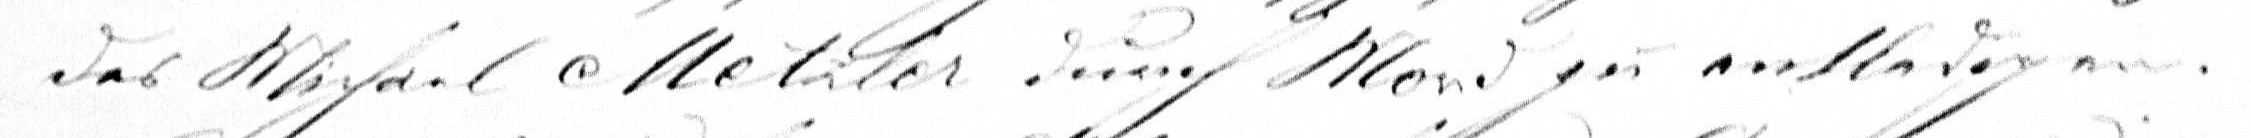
des Michael Metzler durch Mord zu entledigen.
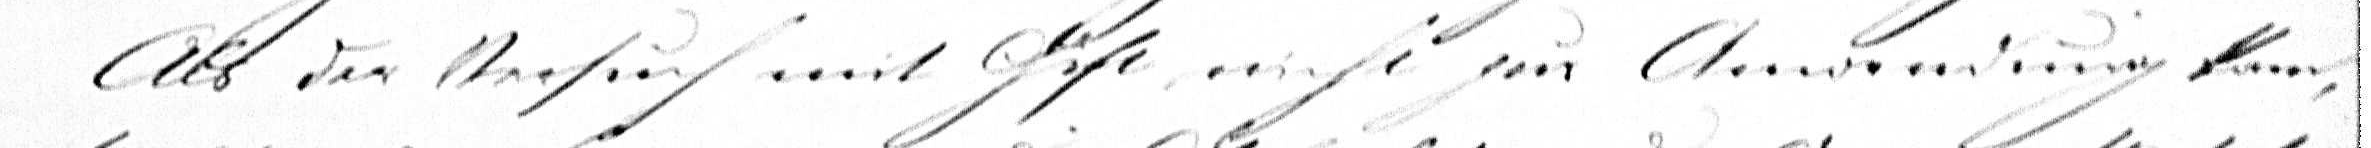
Als der Versuch mit Gift nicht zur Anwendung kam,
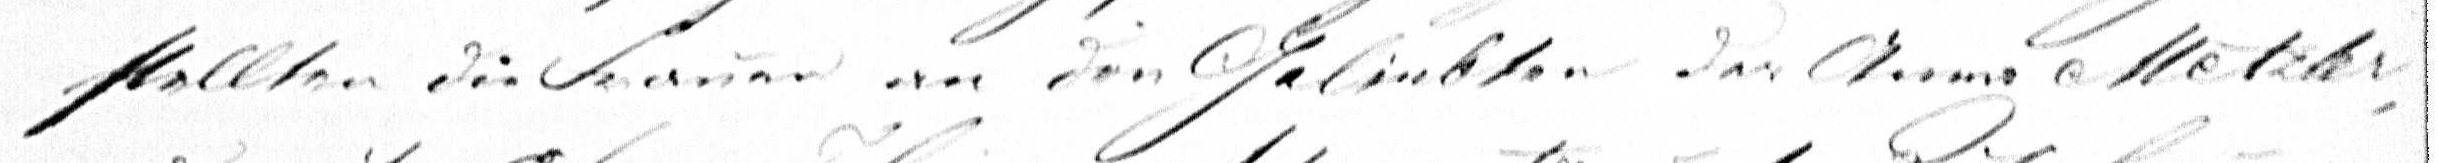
stellten die Frauen an die Geliebte der Anna Metzler,
